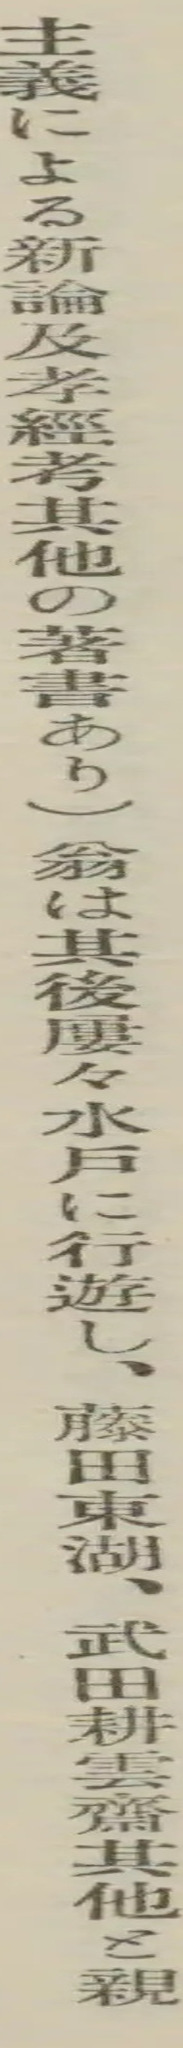主義による新論及孝經考其他の著書あり)翁は其後屢々水戸に行遊し、藤田東湖、武田耕雲斎其他と親
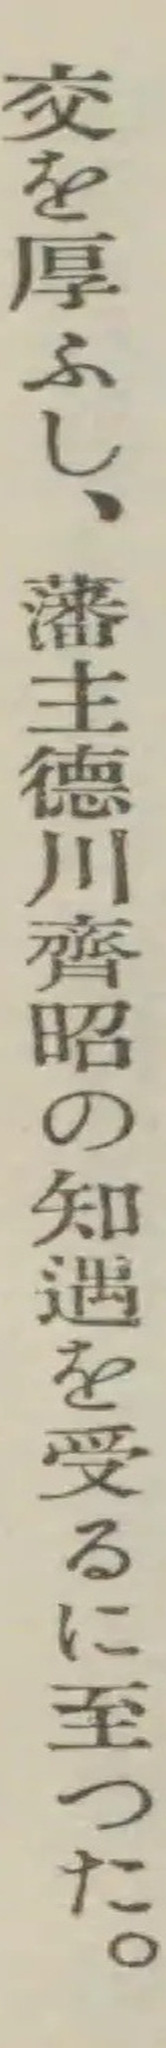交を厚ふし、藩主徳川齊昭の知遇を受るに至つた。
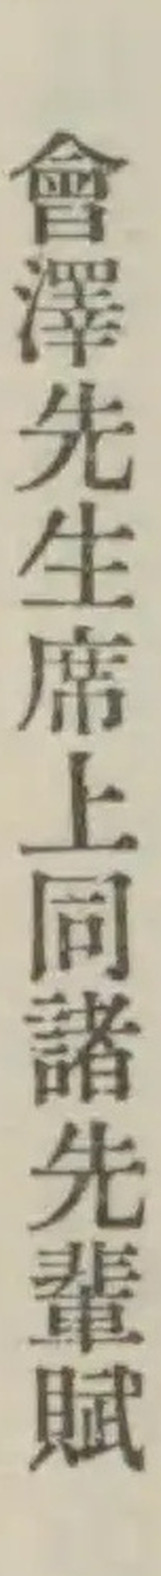會澤先生席上同諸先輩賦
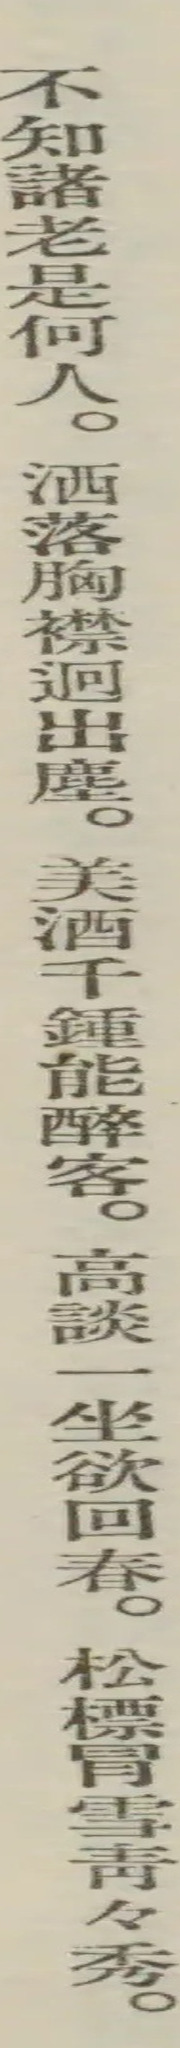不知諸老是何人。酒落胸襟迥出塵。美酒千鍾能酔客。高談一坐欲回春。松標冒雪青々秀。
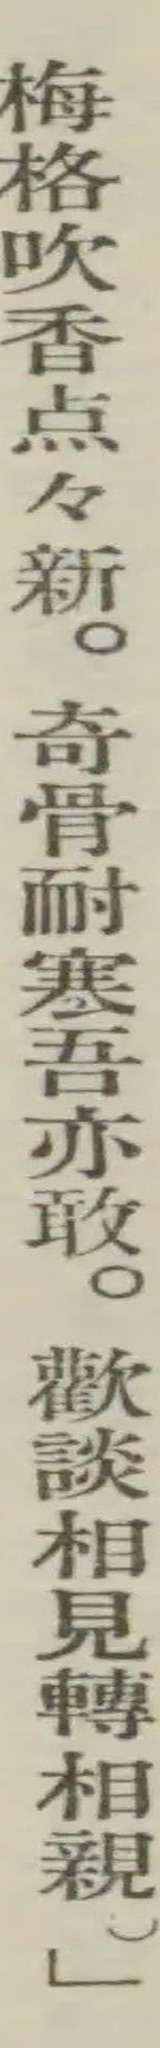梅格吹香点々新。奇骨耐寒吾亦敢。歓談相見転相親。」
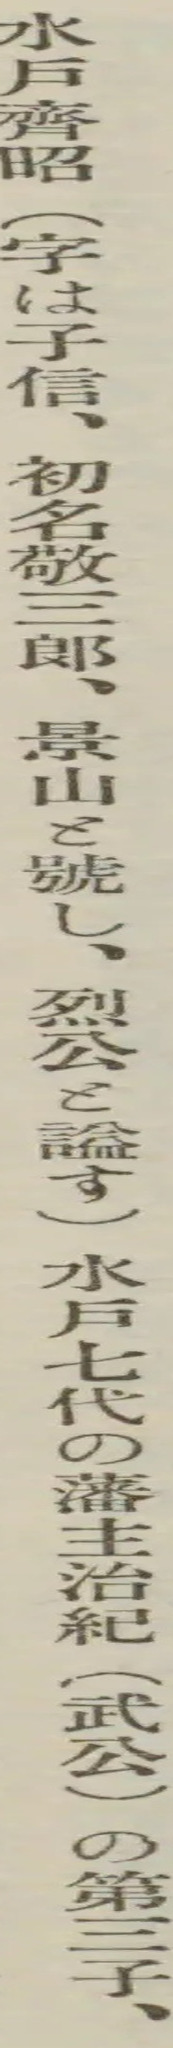水戸齊昭(字は子信、初名敬三郎、景山と号し、烈公と諡す)水戸七代の藩主治紀(武公)の第三子、
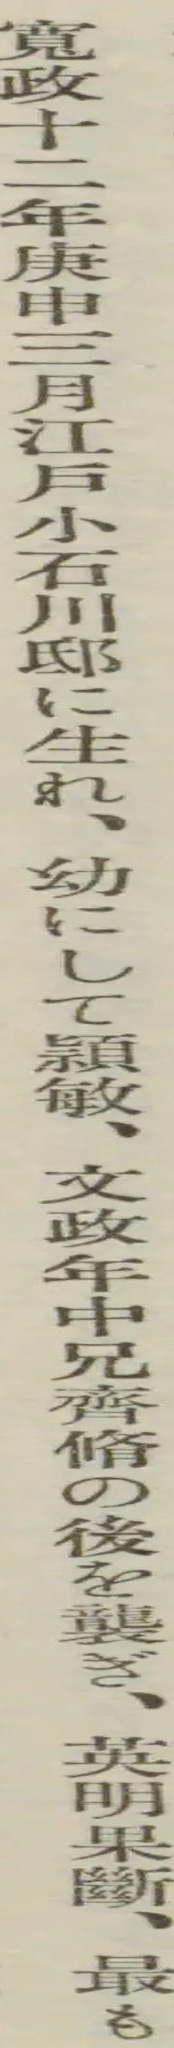寛政十二年庚申三月江戸小石川邸に生れ、幼にして頴敏、文政年中兄齊脩の後を襲ぎ、英明果断、最も
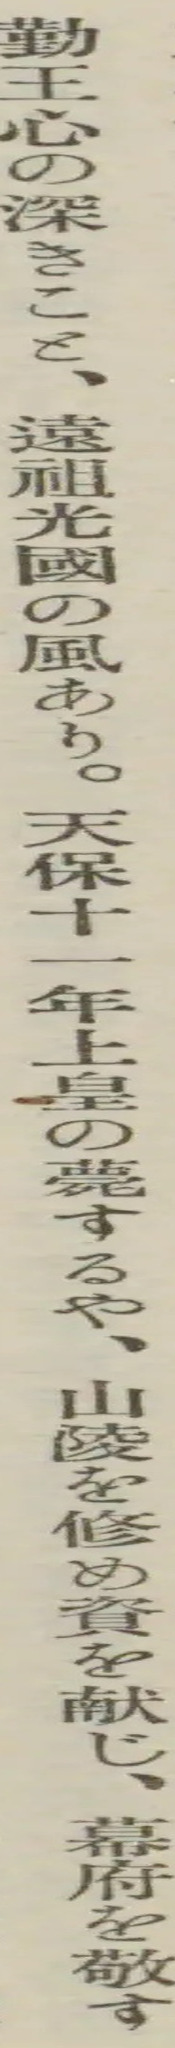勤王心の深きこと、遠祖光國の風あり。天保十一年上皇の薨するや、山陵を修め資を献じ、幕府を敬す
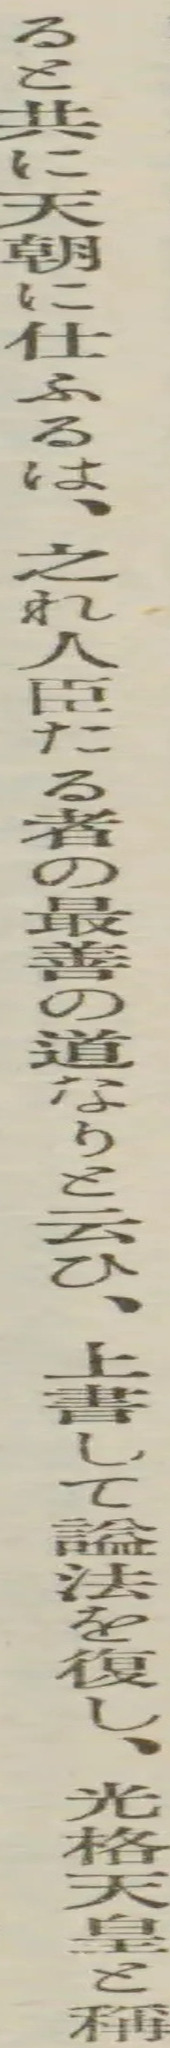ると共に天朝に仕ふるは、之れ人臣たる者の最善の道なりと云ひ、上書して諡法を復し、光格天皇と称
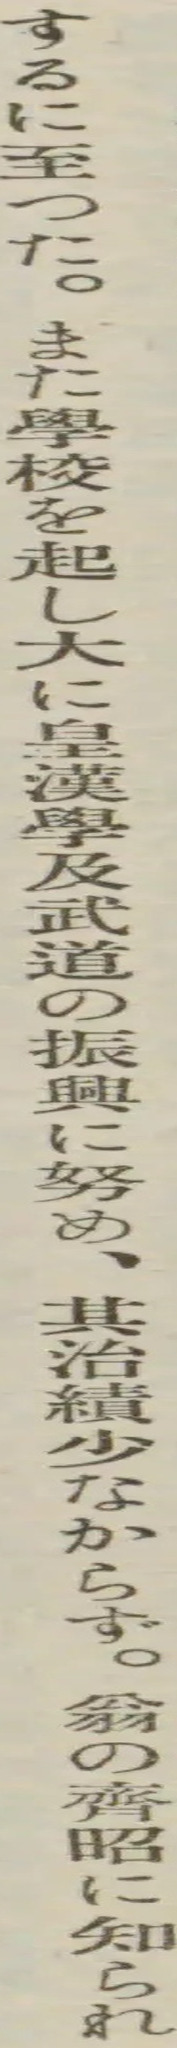するに至つた。また学校を起し大に皇漢学及武道の振興に努め、其治績少なからず。翁の齊昭に知られ
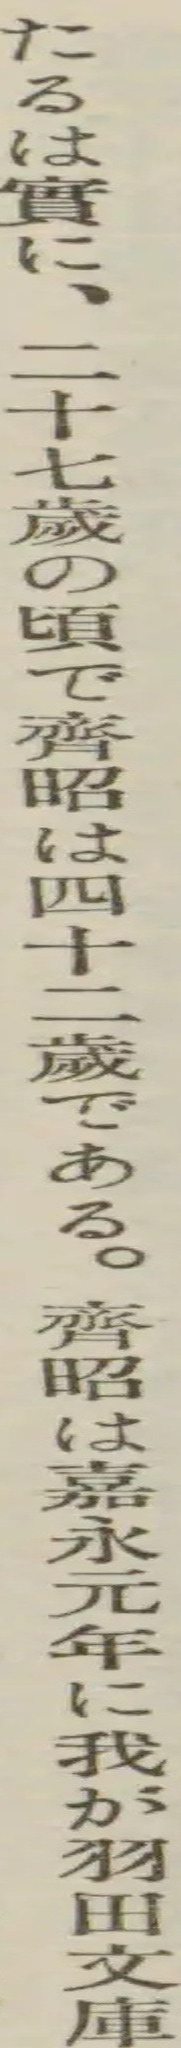たるは実に、二十七歳の頃で齊昭は四十二歳である。齊昭は嘉永元年に我が羽田文庫へ「破邪集」八巻
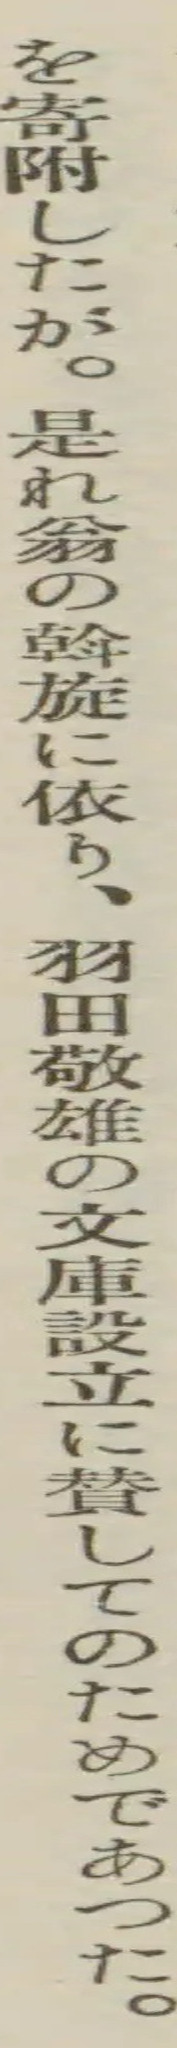を寄附したが。是れ翁の斡旋に依り、羽田敬雄の文庫設立に賛してのためであつた。
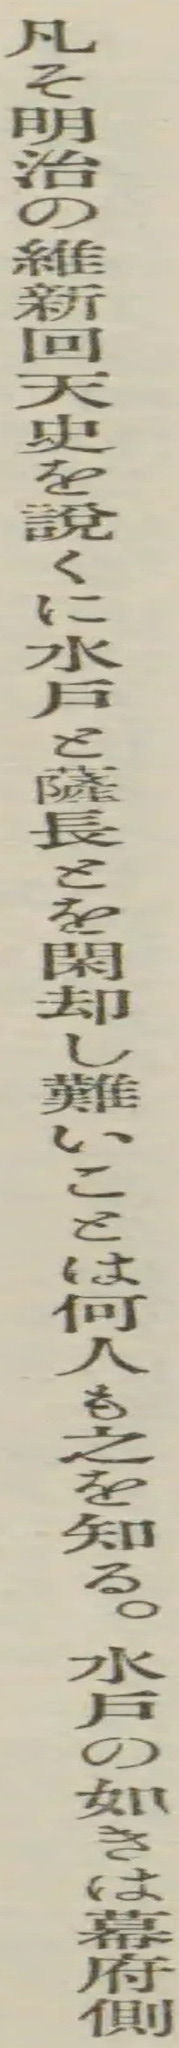凡そ明治の維新回天史を説くに水戸と薩長とを閑却し難いことは何人も之を知る。水戸の如きは幕府側
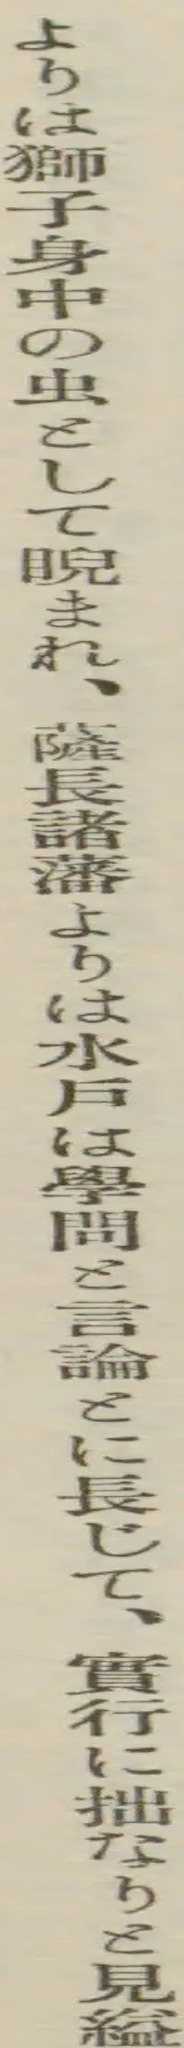よりは獅子身中の虫として睨まれ、薩長諸藩よりは水戸は学問と言論とに長じて、実行に拙なりと見縊
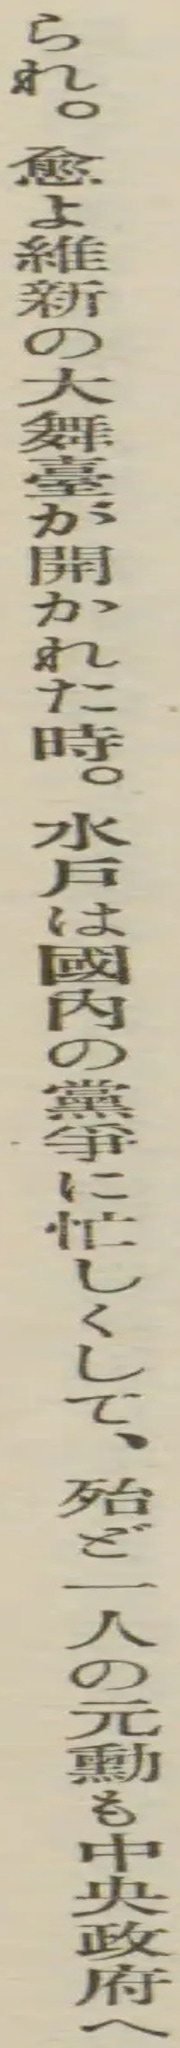られ。愈よ維新の大舞台が開かれた時。水戸は国内の党争に忙しくして、殆ど一人の元勲も中央政府へ

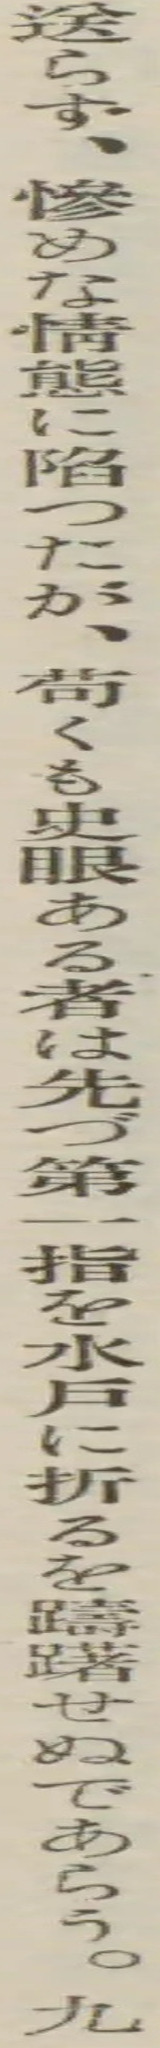送らず、惨めな状態に陥つたが、苟も史眼ある者は先づ第一指を水戸に折るを躊躇せぬであらう。九
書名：小野湖山翁小伝
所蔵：国立国会図書館 National Diet Library, JAPAN
